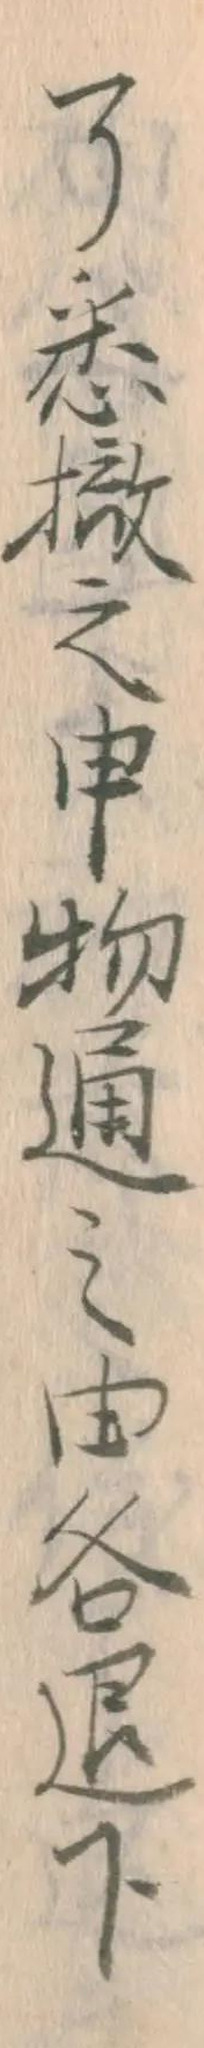了悉撒之申物通之由各退下
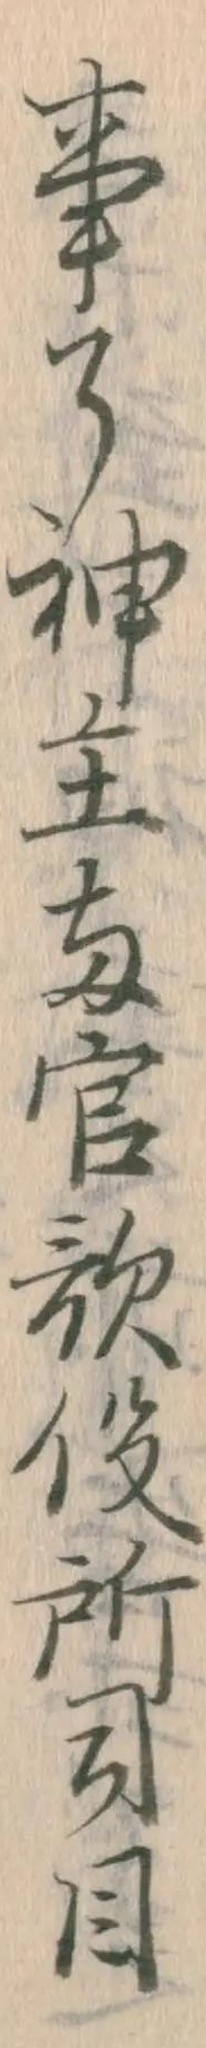事了神主両官歌役所司目
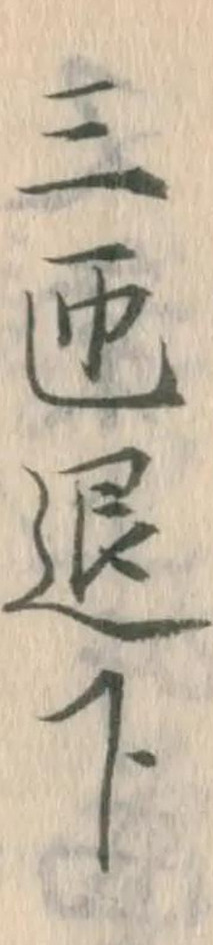三匝退下
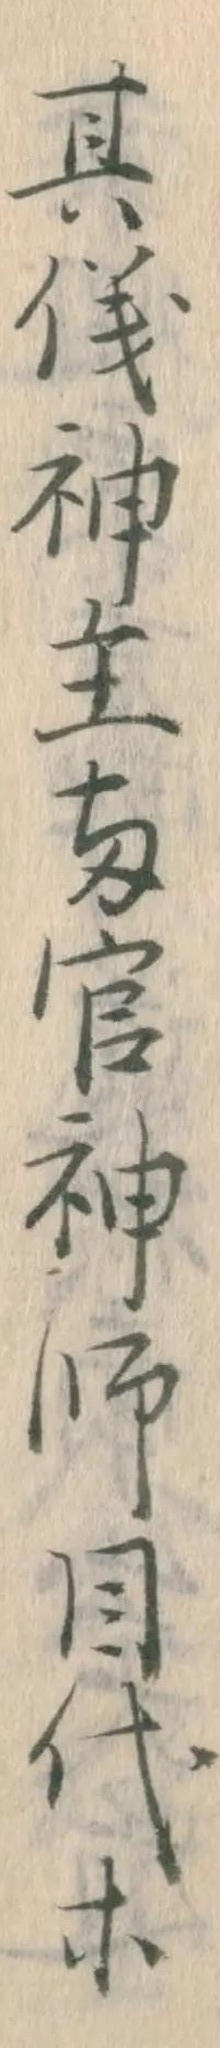其儀神主両官神師目代等
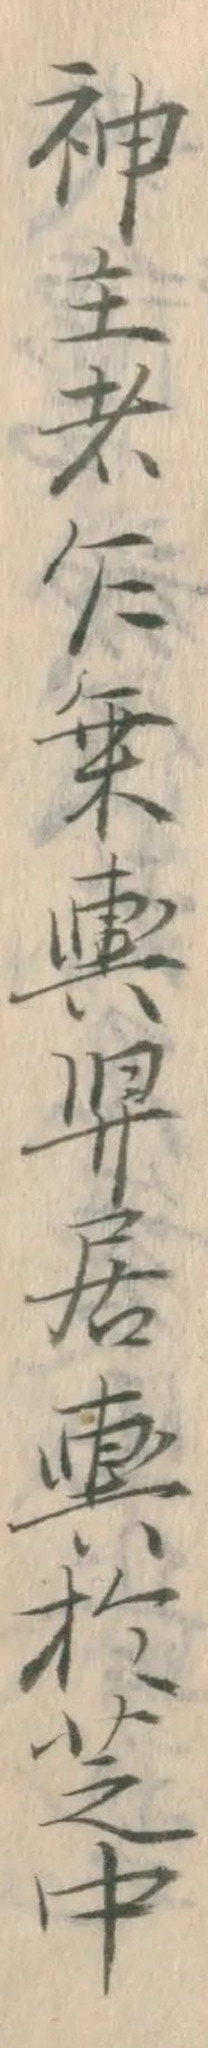神主者乍乗輿舁居輿於芝中

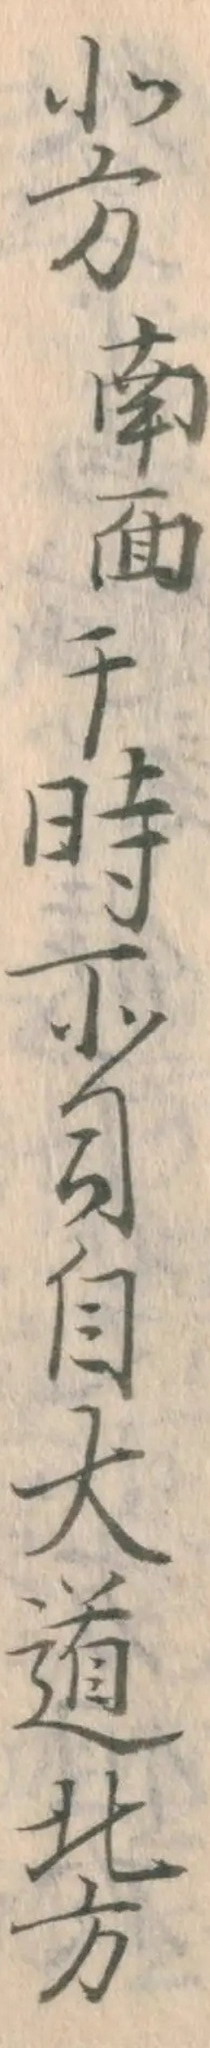北方南面于時所司自大道北方
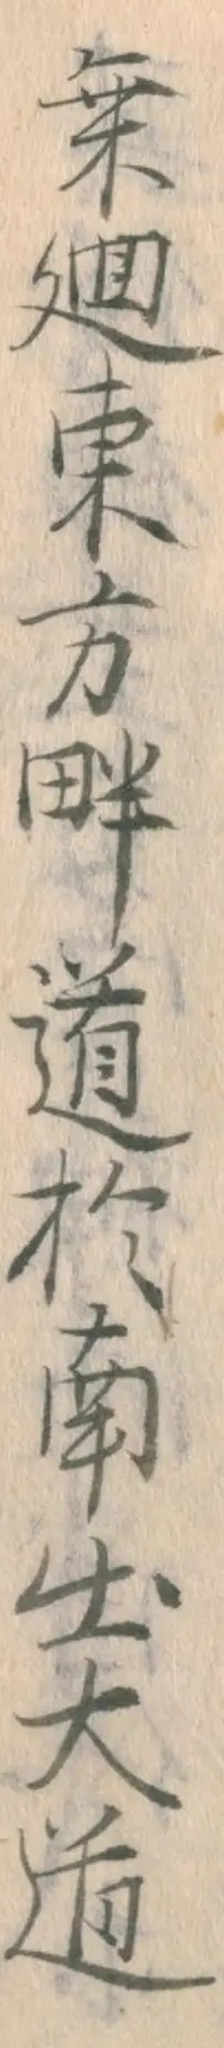乗廻東方畔道於南出大道
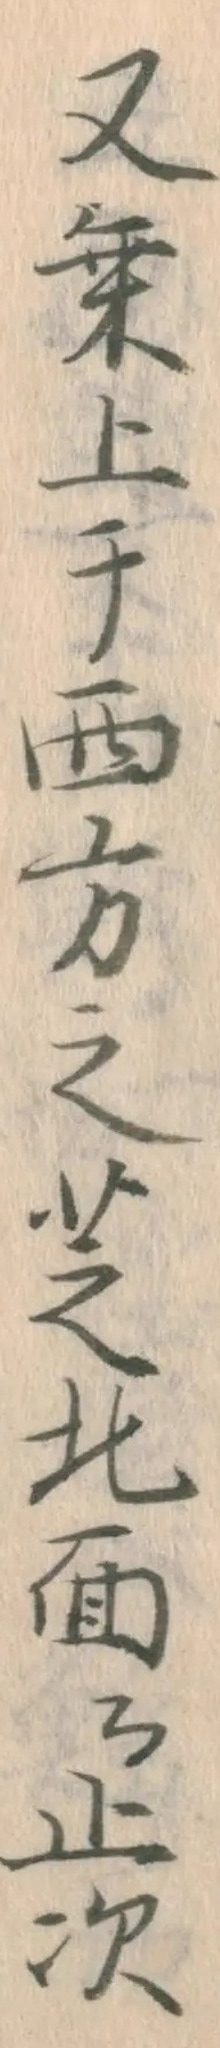又乗上于西方之芝北面而止次
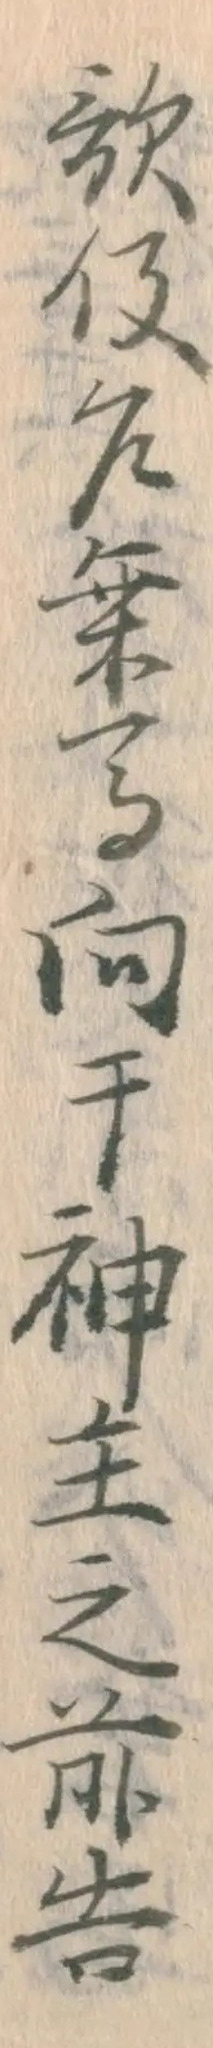歌役乍乗馬向于神主之前告
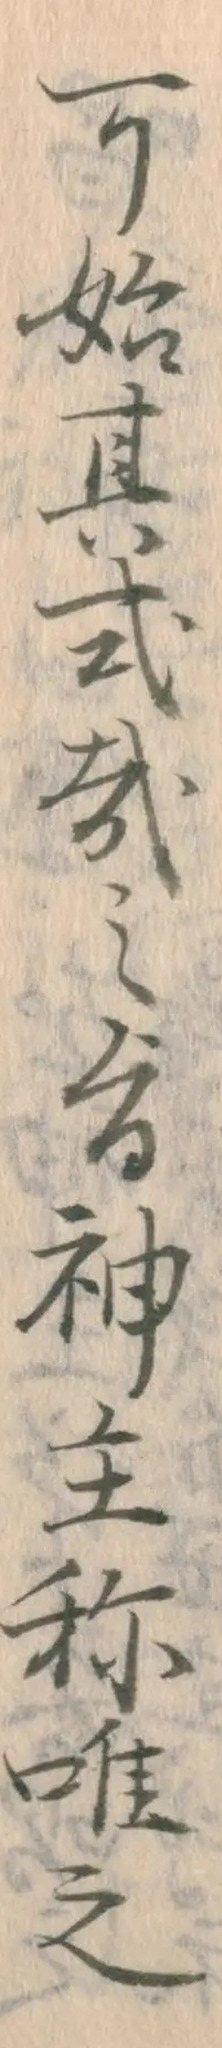可始其式哉之旨神主称唯之
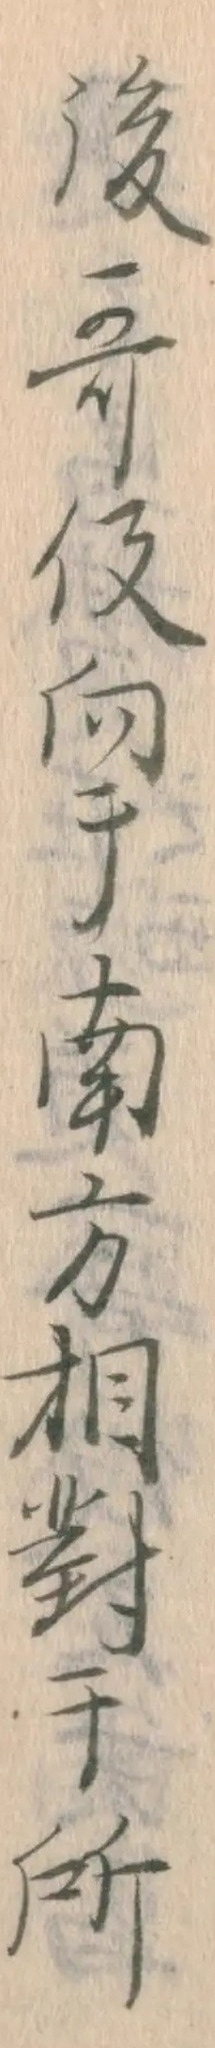後哥役向于南方相対于所
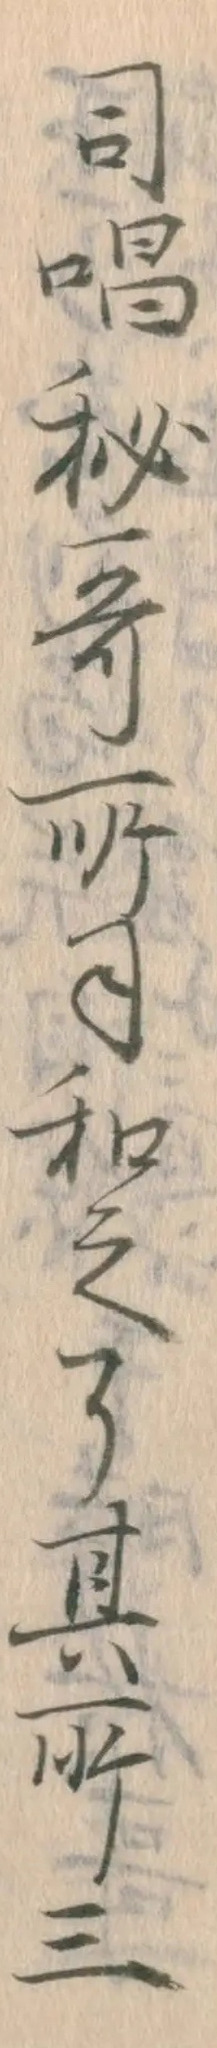司唱秘哥所司和之了其所三
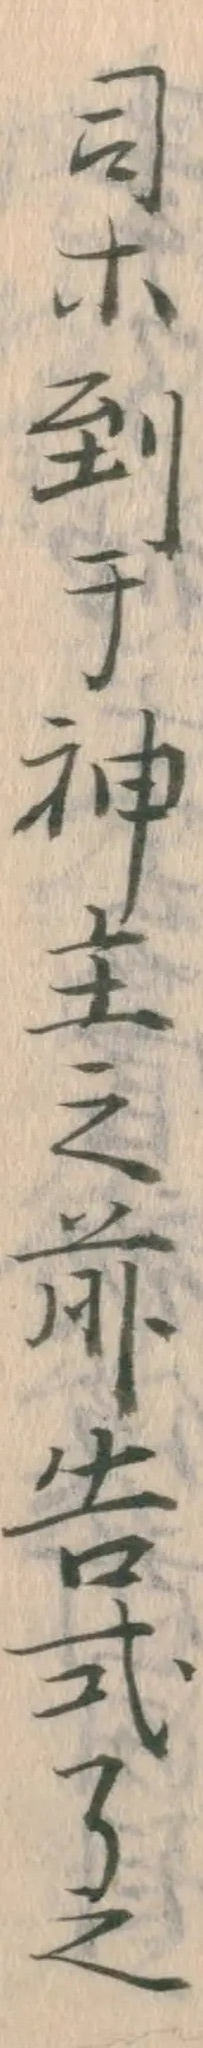司等到于神主之前告式了之
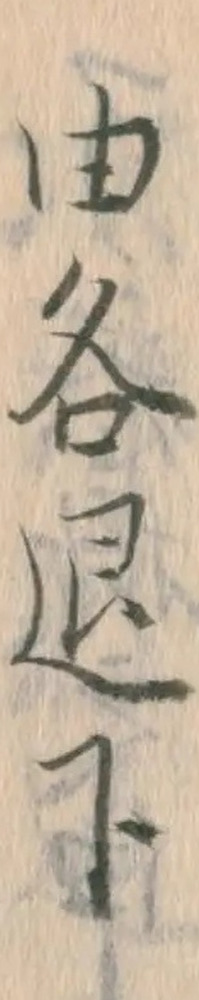由各退下
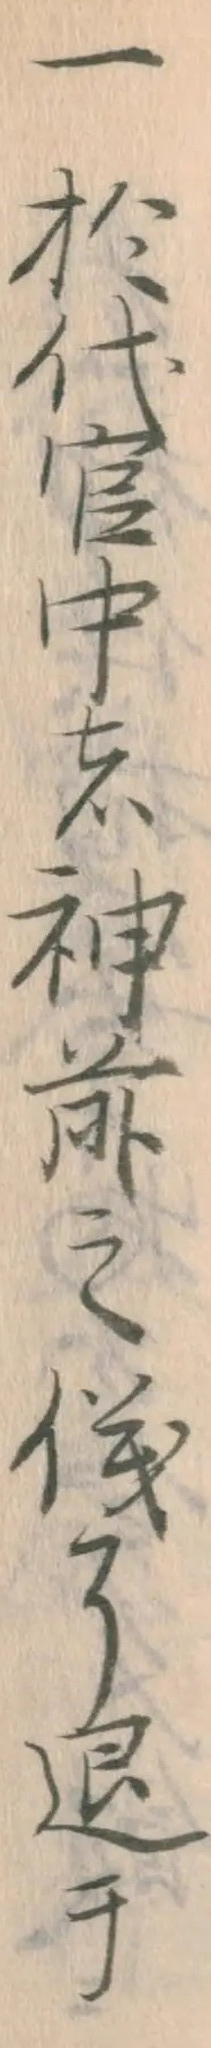一於代官中者神前之儀了退于
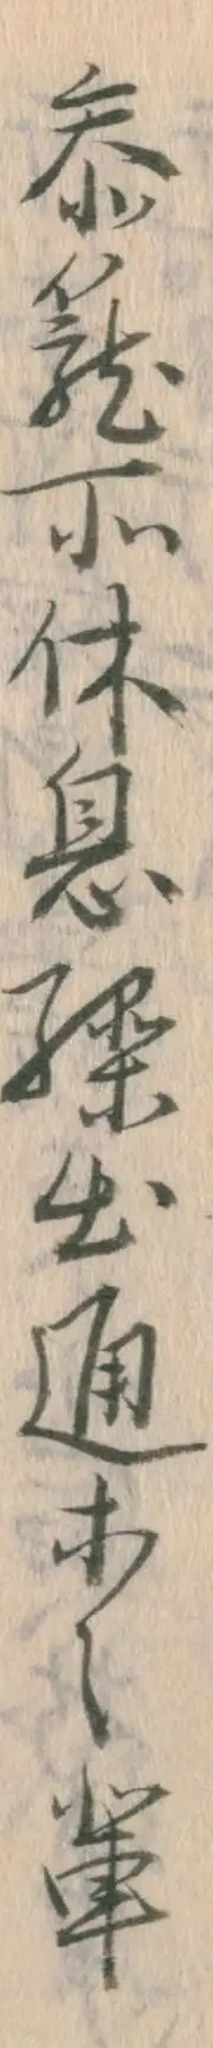参籠所休息繰出通等之輩
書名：賀茂社記録. 第81冊
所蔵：国立国会図書館 National Diet Library, JAPAN
